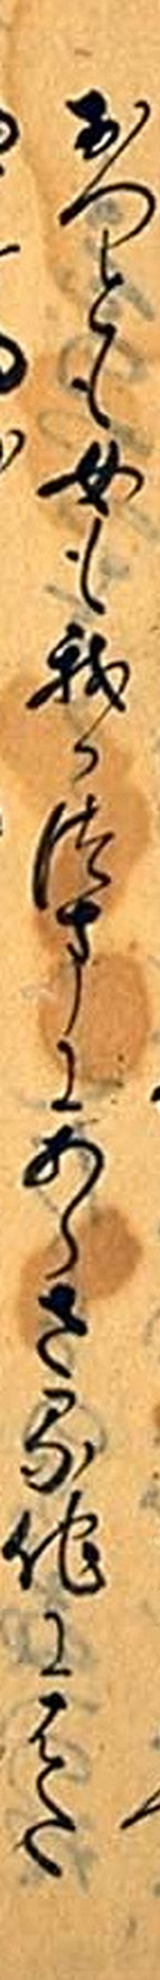おつとも女も我かつまにあらさる他にはた
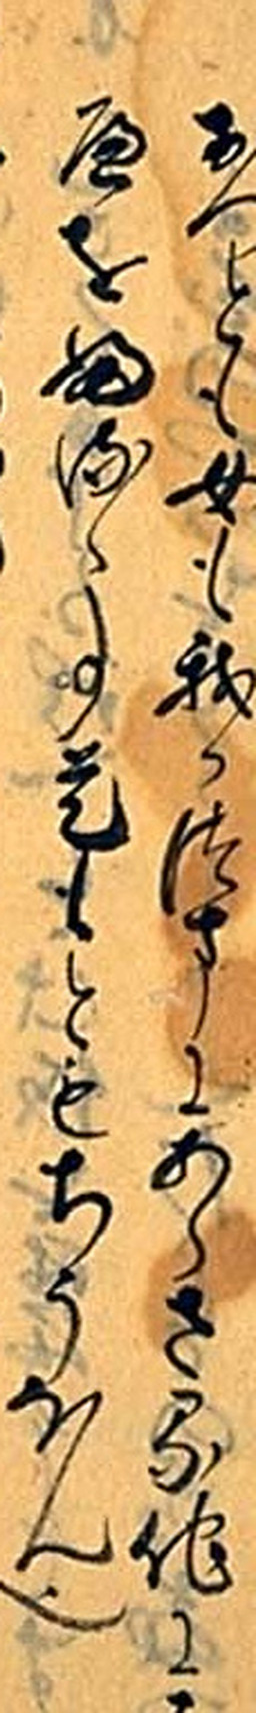へをふるゝ事是もともちうほん也
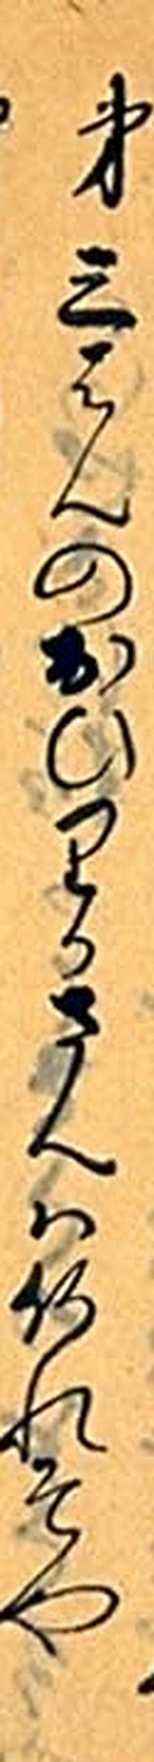弟三はんのおひりかさんは何れそや
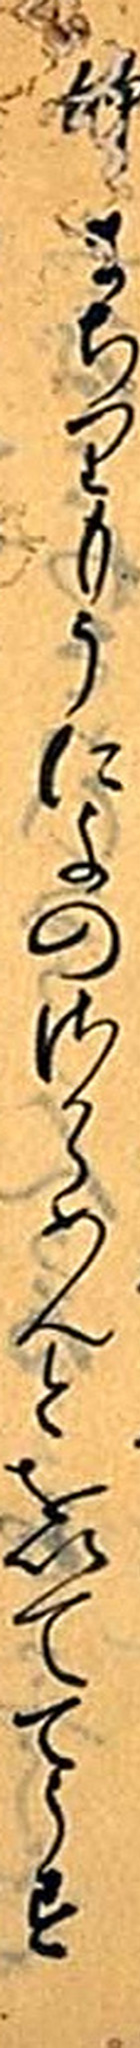師まちりもうによのさからめんとを以ててうす
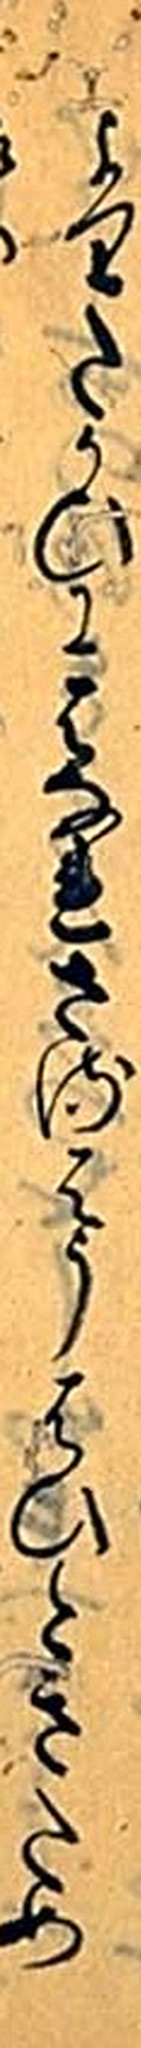よりたかひにはなれさるはうはひとさため
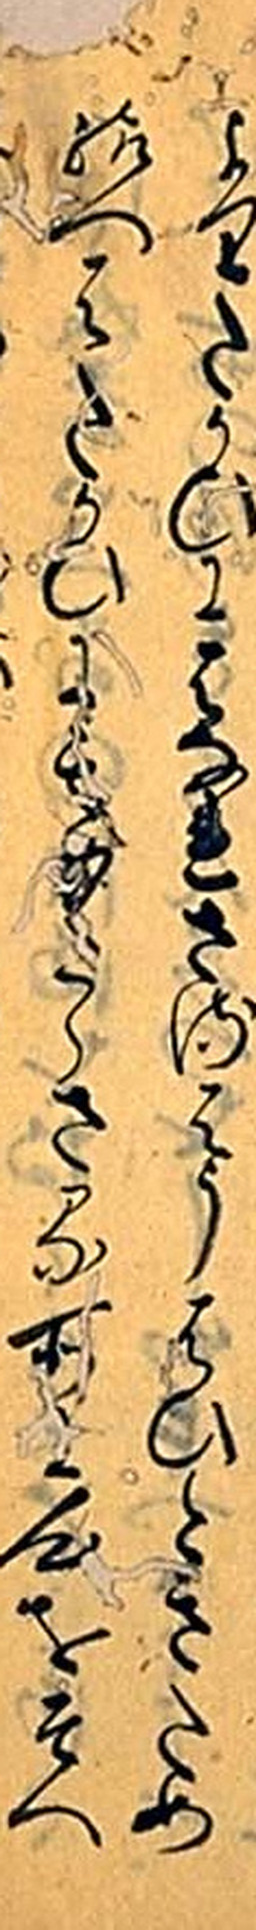給へはたかひに其たらさる所に心をそへ
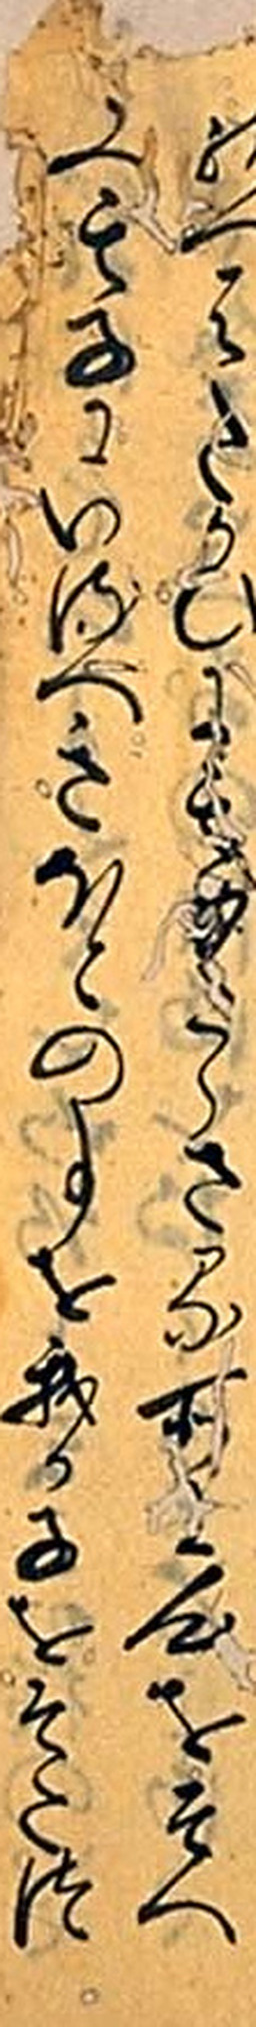又其子にいるへきほとの事を我か子をそたつ
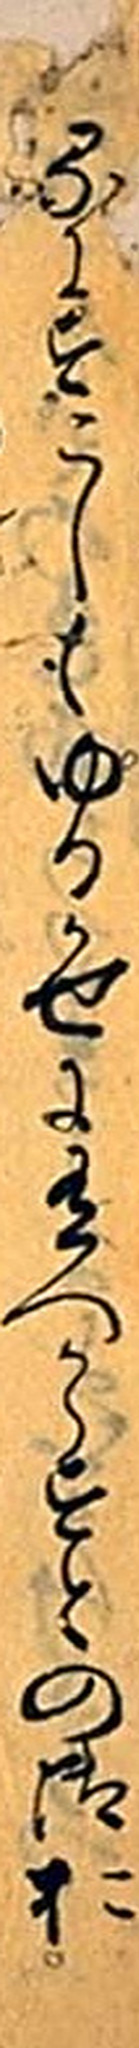るにすこしもゆるかせに有へからすとの御お
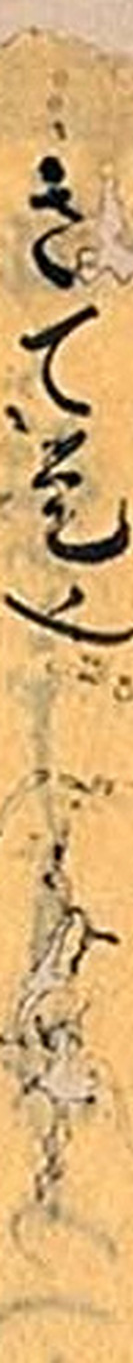きて是也
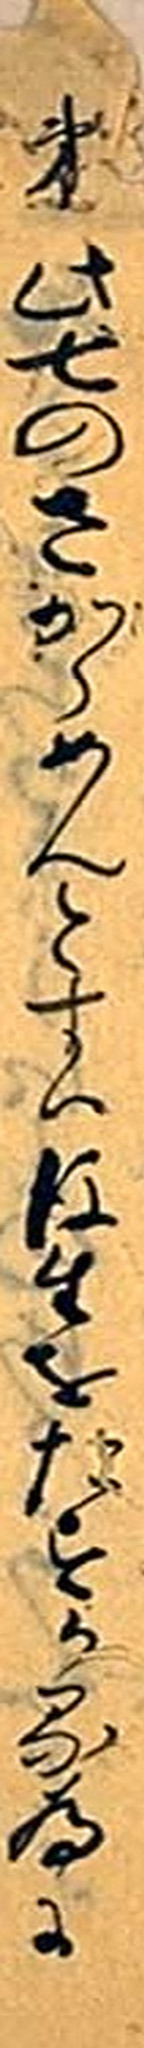弟此七のさからめんとすは後生をたすかる為に
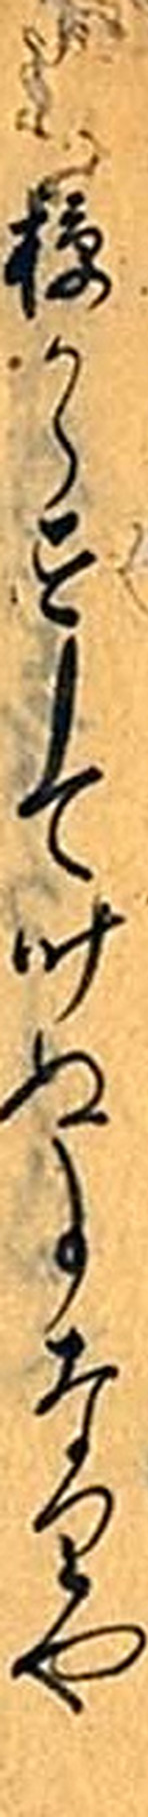授からすして叶ぬ事なりや
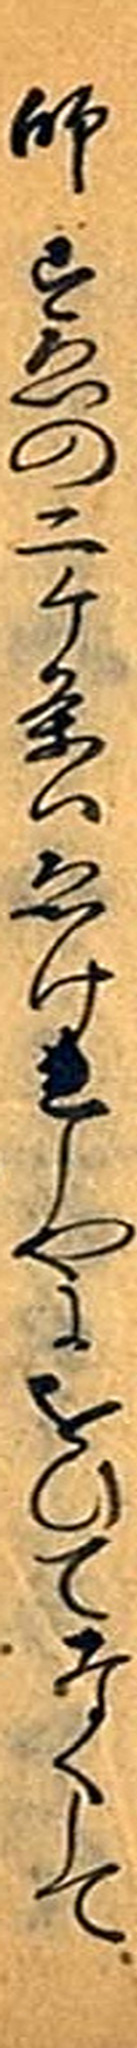師すゑの二ケ条はゑけれしやにをひてなくして
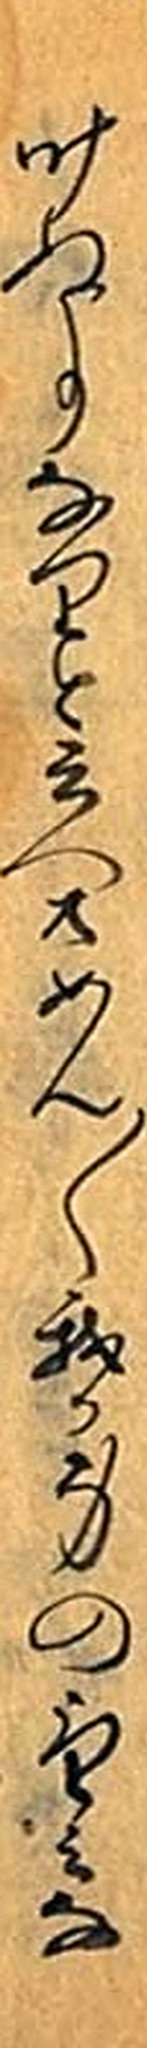叶ぬ事なりと云へ共めん〳〵我か身の望みな
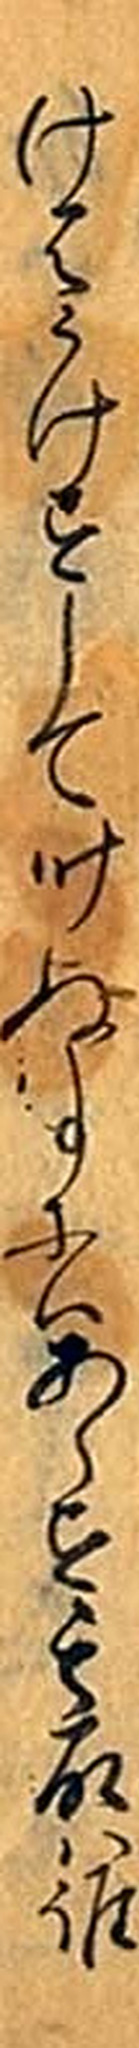けはうけすして叶ぬ事にはあらす其故は誰
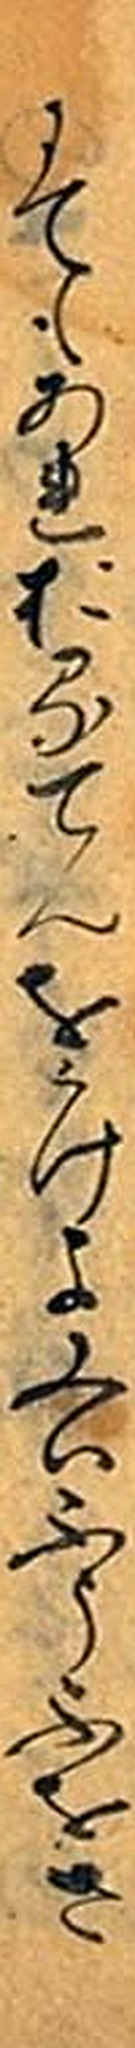にてもあれおるてんをうけよ又はふうふをさ
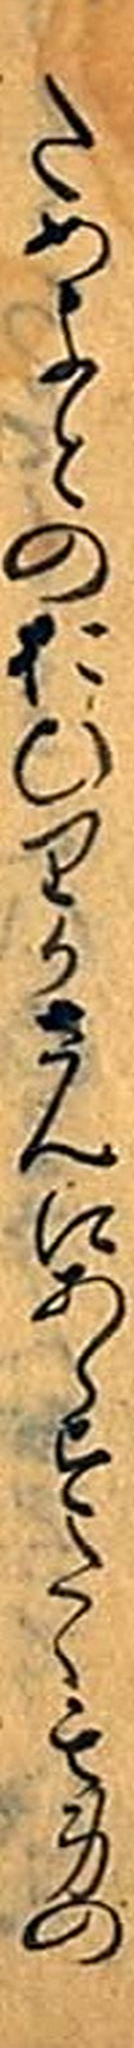ためよとのおひりかさんにあらすたゝ其身の
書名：ドチリナ・キリシタン
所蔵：東京大学総合図書館 / General Library in the University of Tokyo
